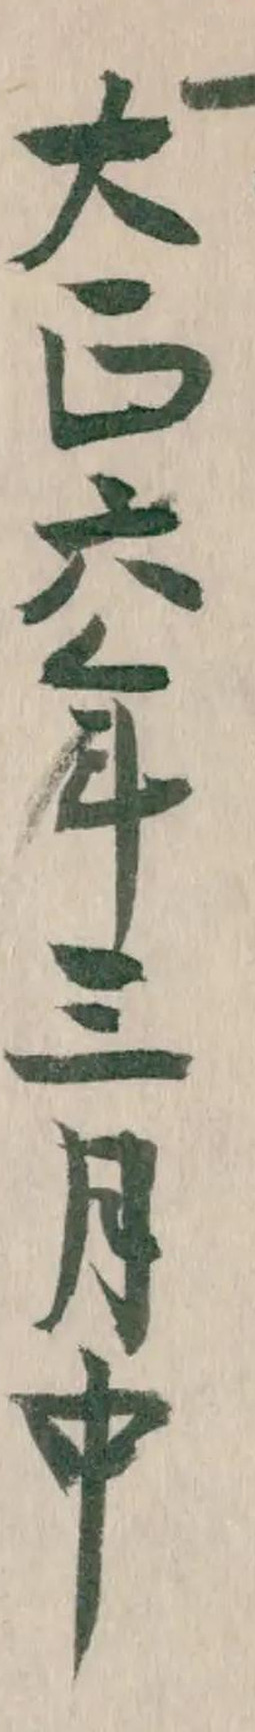大正六年三月中
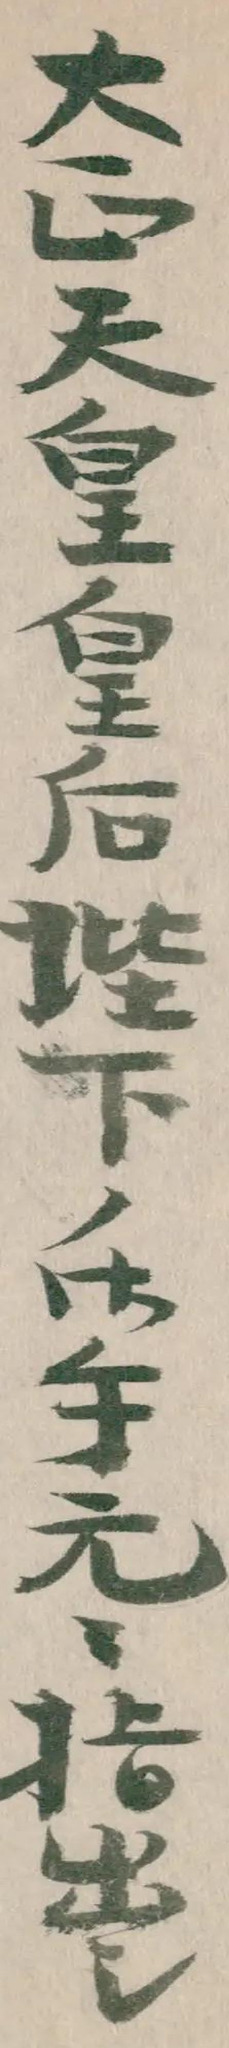大正天皇皇后陛下ノ御手元ニ指出シ
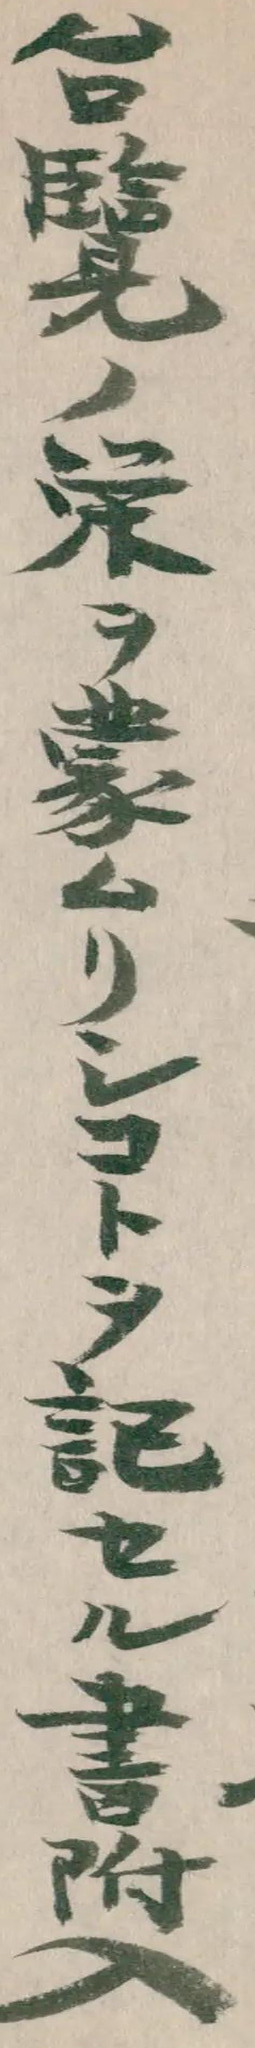台覧ノ栄ヲ蒙ムリシコトヲ記セル書附入
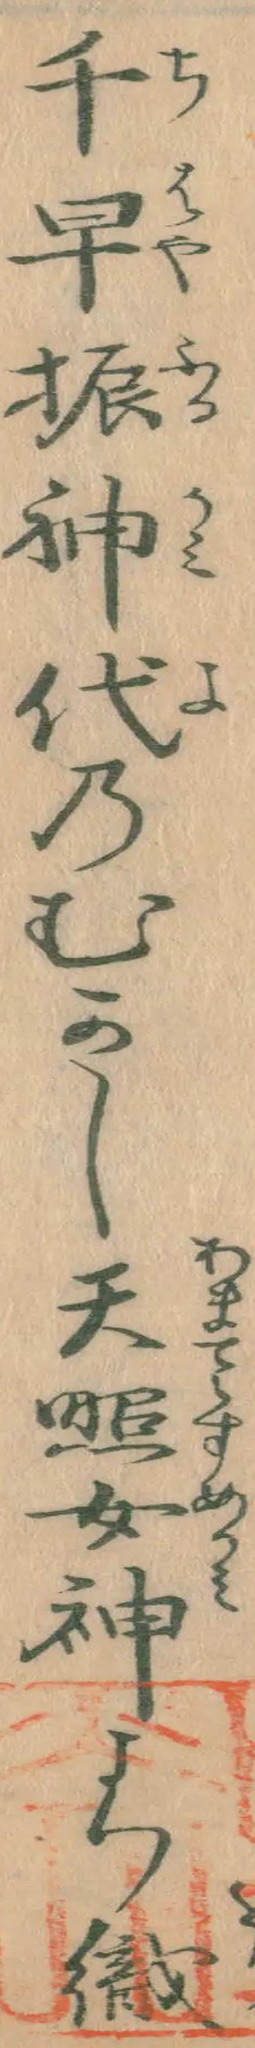千早振神代のむかし天照女神より織
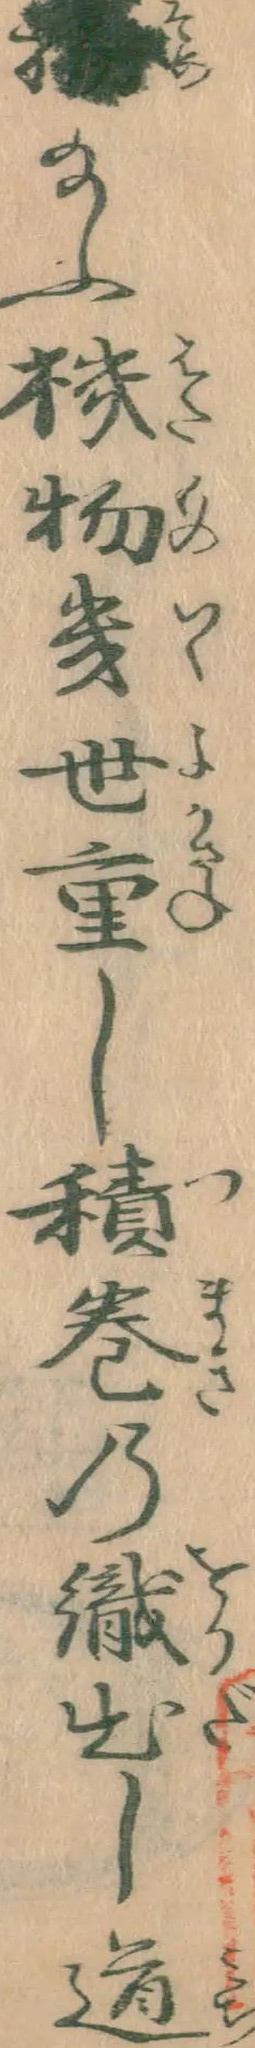給ふ機物幾世重し積巻の織出し道
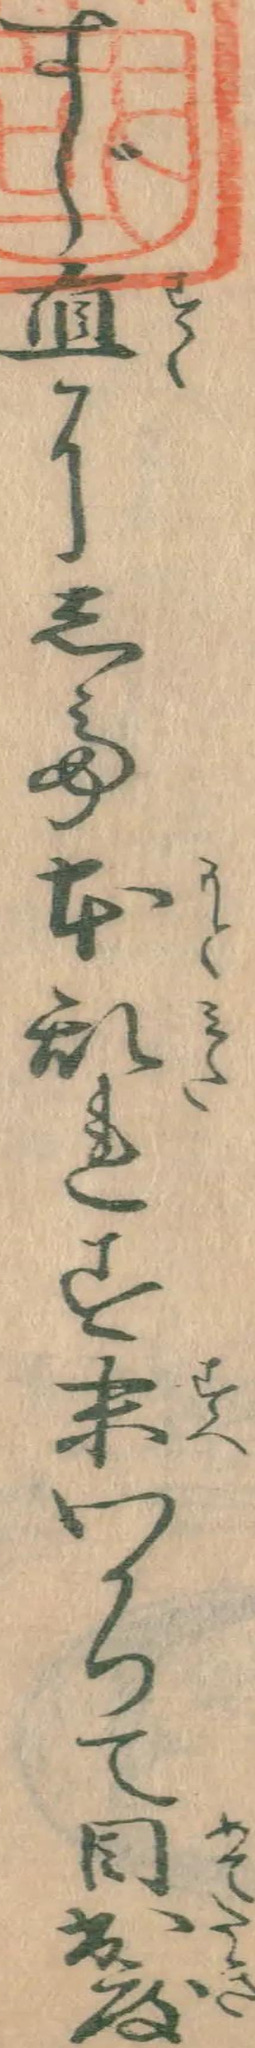すじ直にした本乱れす末わかりて目出度
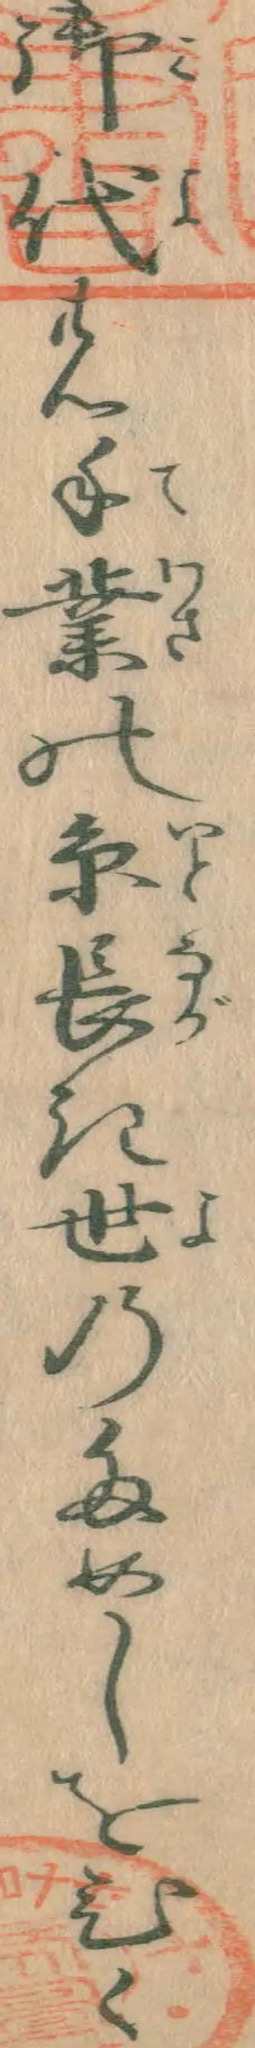御代の手業の糸長き世のためしをひく
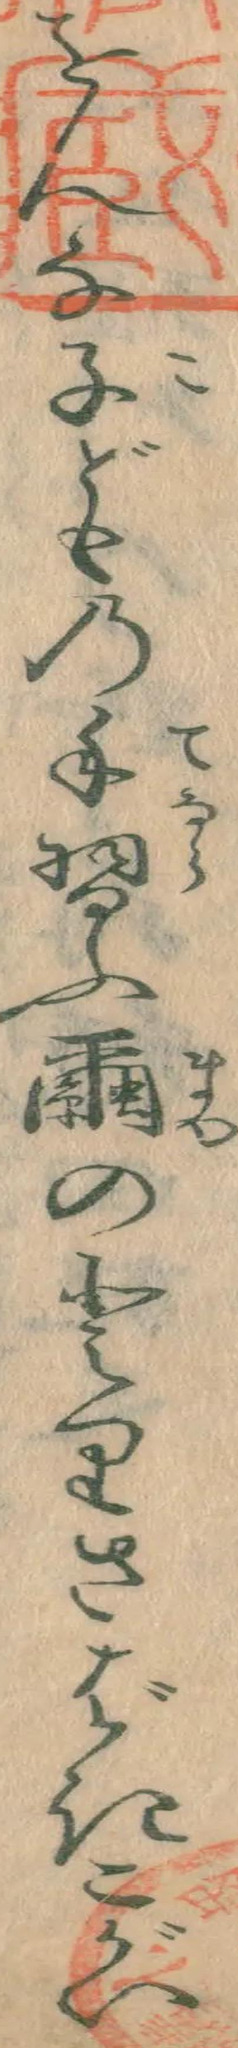をんな子どもの手習ふ繭のとりさばきこがい
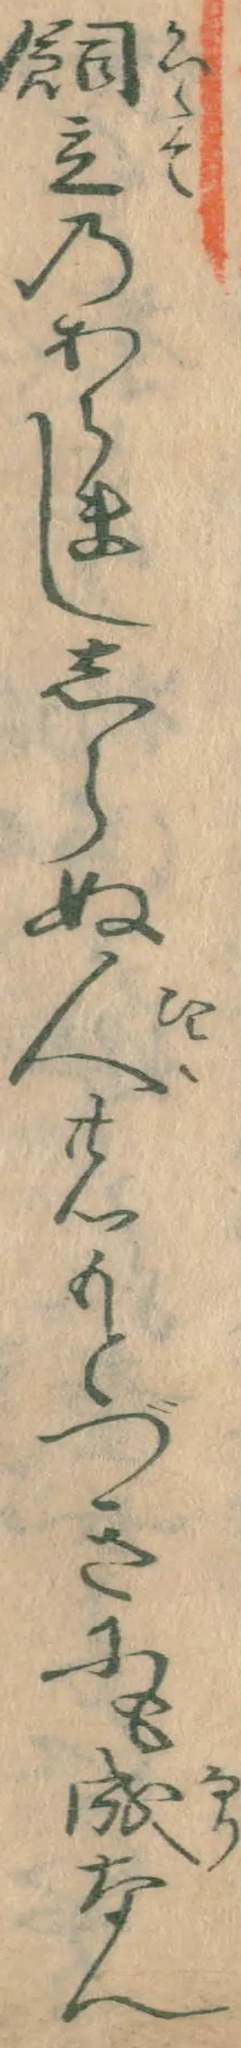飼立のあらまししらぬ人のもとづきにも成なん
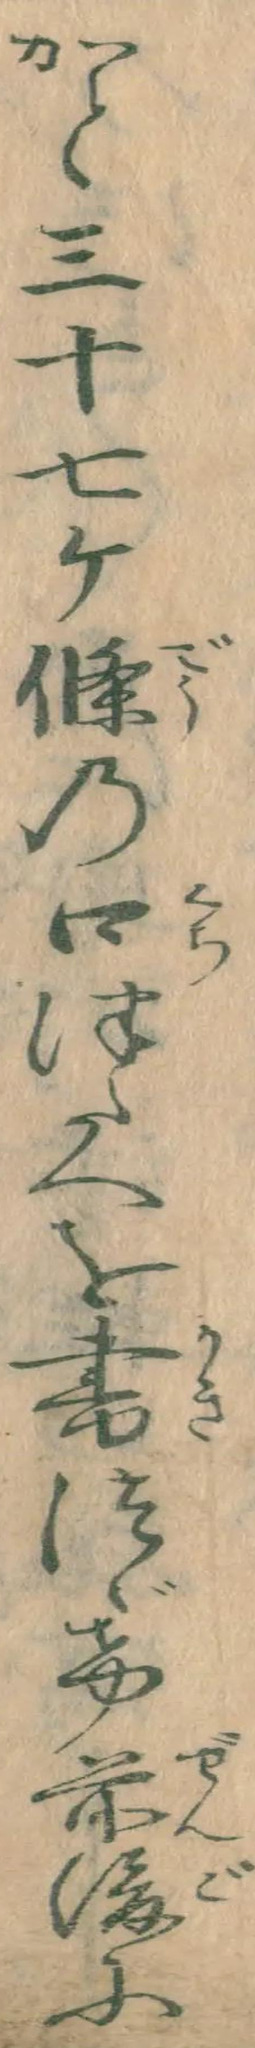かと三十七ヶ條の口つたへを書つゞけ前後に
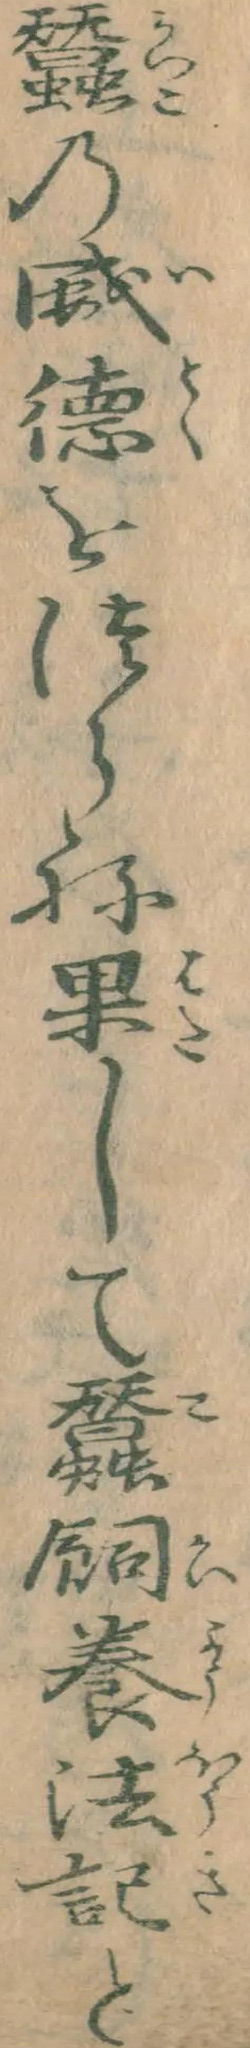蠶の威徳つらね果して蠺飼養法記と

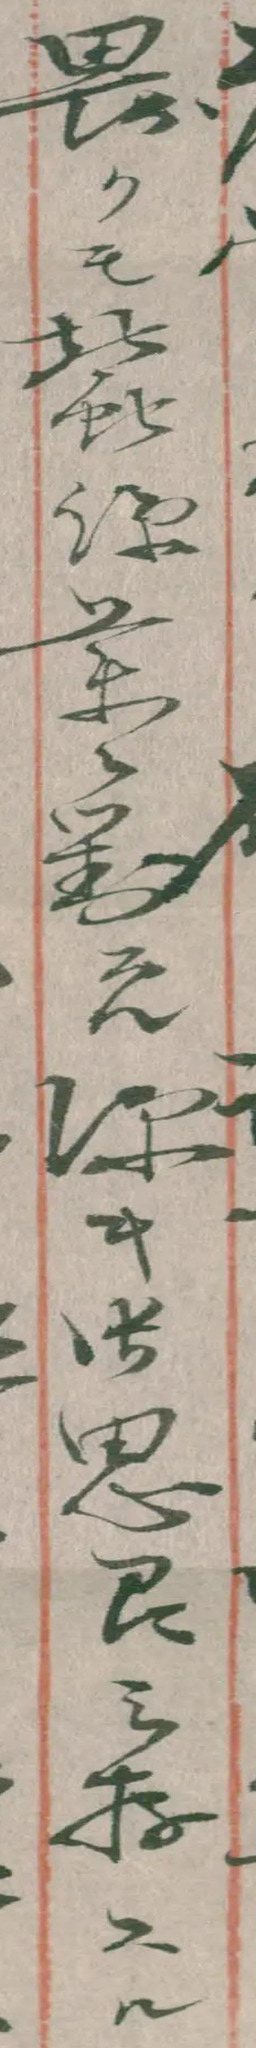畏クモ蚕係業ニ対スル深キ御思召之存スル
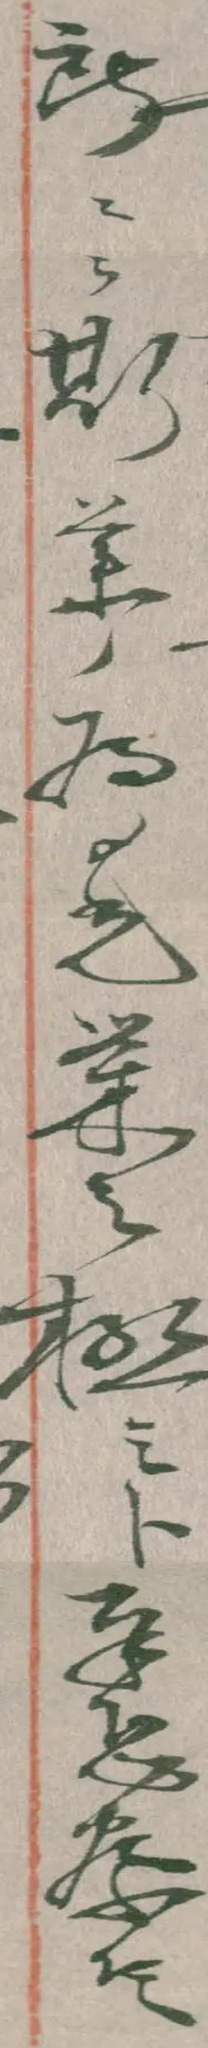所ニテニ斯業ノ為メ光栄之極ミト奉恐察候
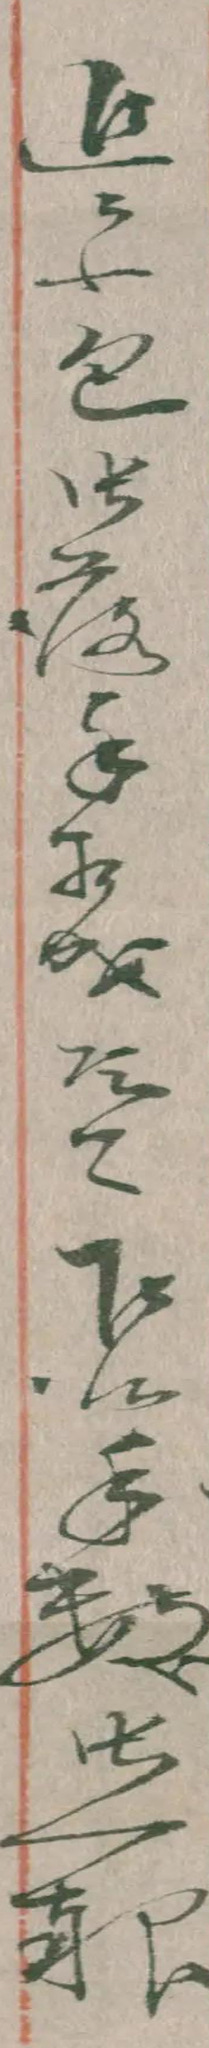近々小包御落手相成候ハヽ乍御手数御一報
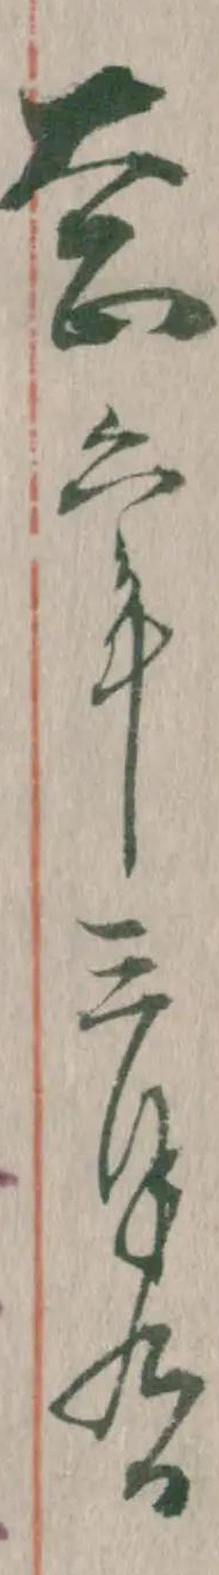大正六年三月九日
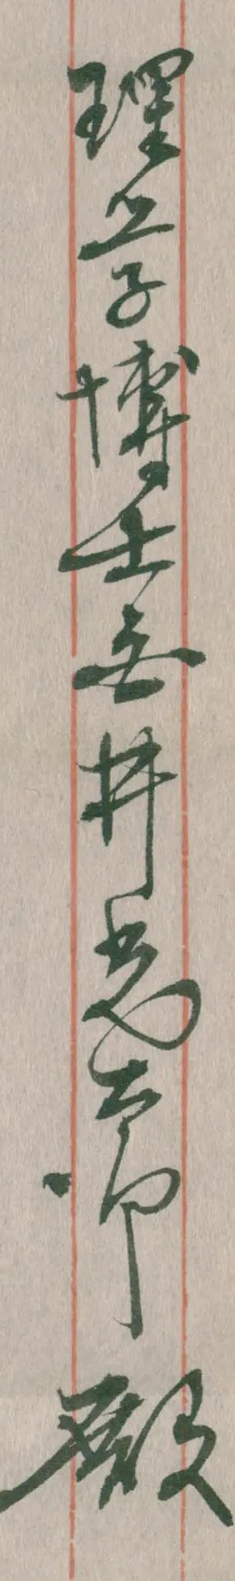理学博士白井光太郎殿
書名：蚕飼養法記
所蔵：国立国会図書館 National Diet Library, JAPAN
